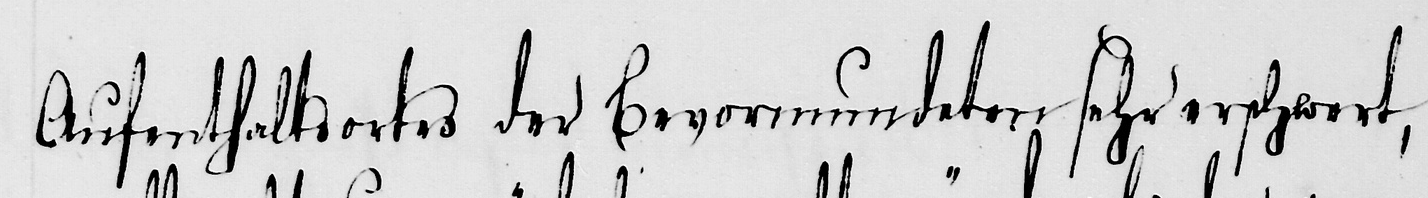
Aufenthaltsortes der Bevormundeten sehr erschwert,
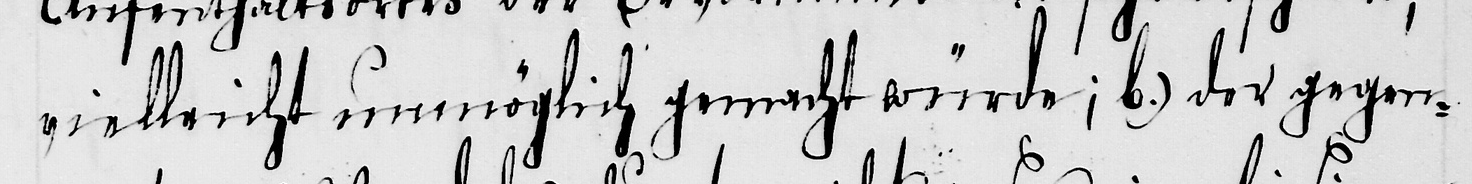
vielleicht unmöglich gemacht würde; b.) der gegen¬
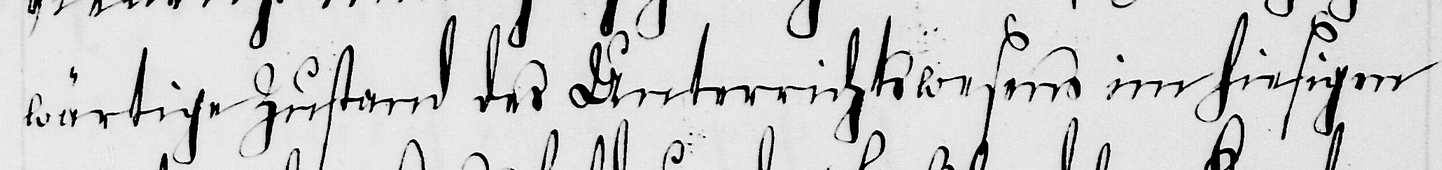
wärtige Zustand des Unterrichtswesens im hiesigen
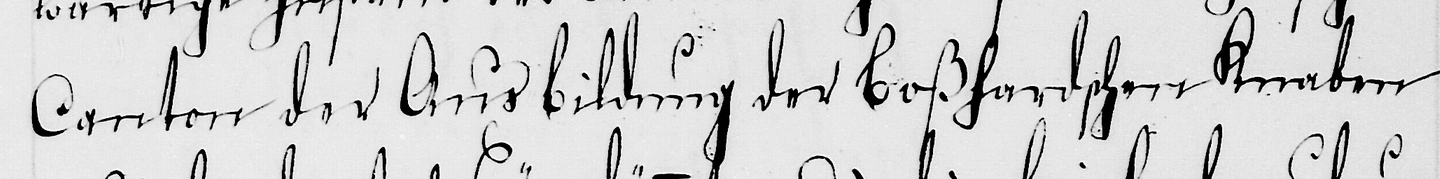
Canton der Ausbildung der Boßhardscher Knaben
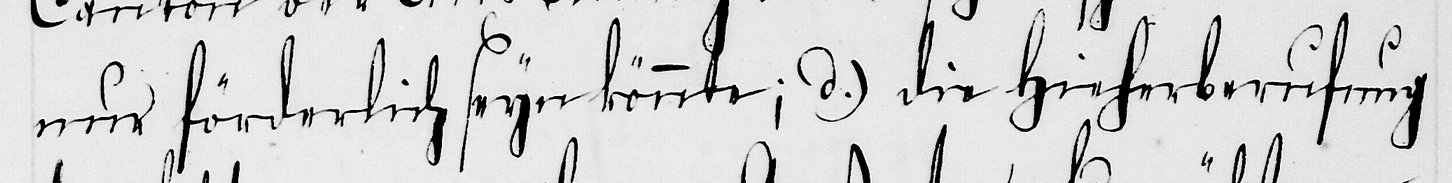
nur förderlich seyn könnte; d.) Die Hieherberufung
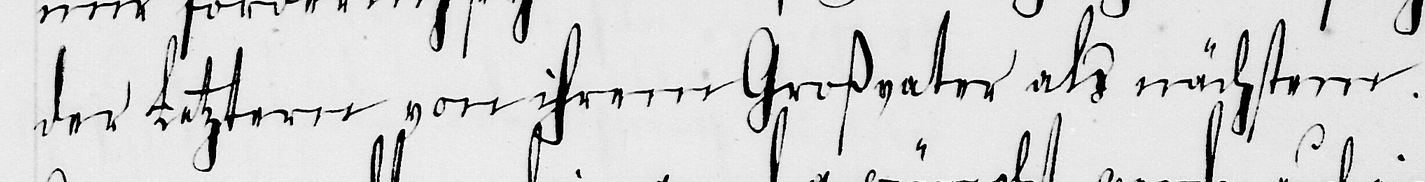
der Letztern von ihrem Großvater als nächstem
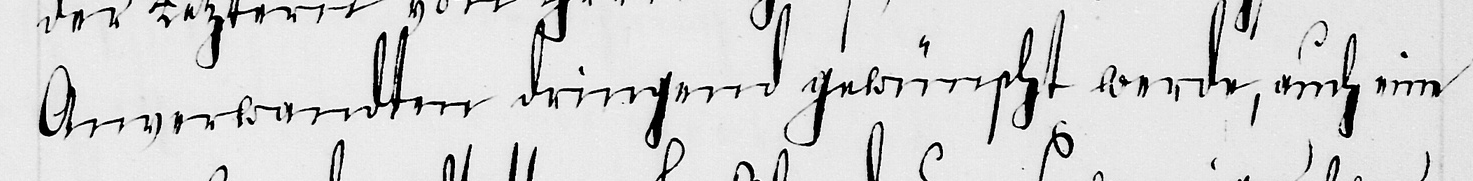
Anverwandten dringend gewünscht werde, auch eine
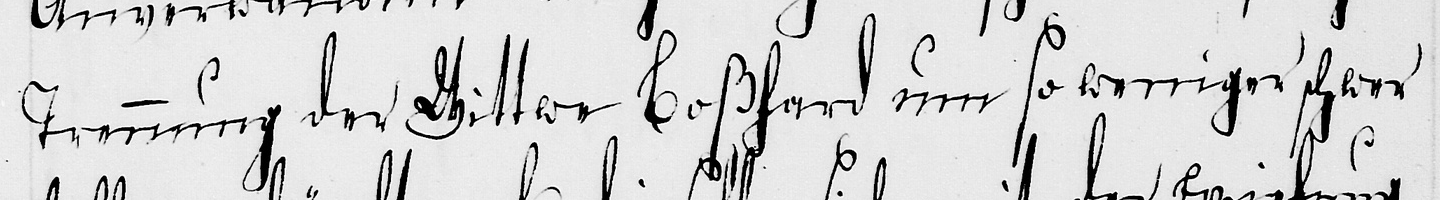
Trennung der Wittwe Boßhard um so weniger schwer
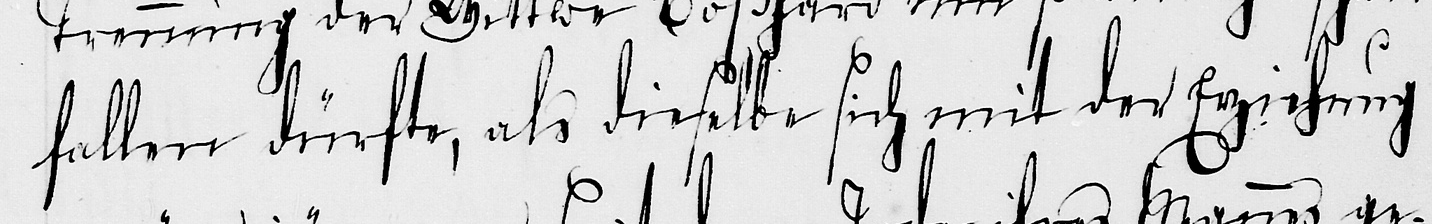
fallen dürfte, als dieselbe sich mit der Erziehung
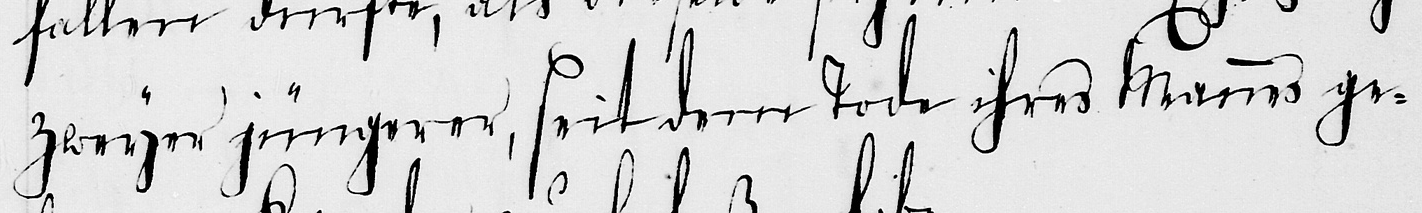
zweyer jüngerer, seit dem Tode ihres Mannes ge¬
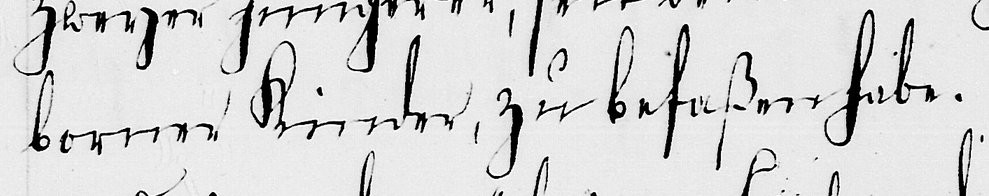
borener Kinder, zu befaßen habe.
